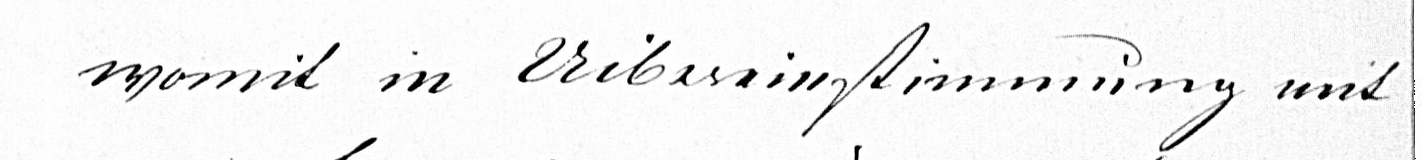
womit in Uibereinstimmung mit
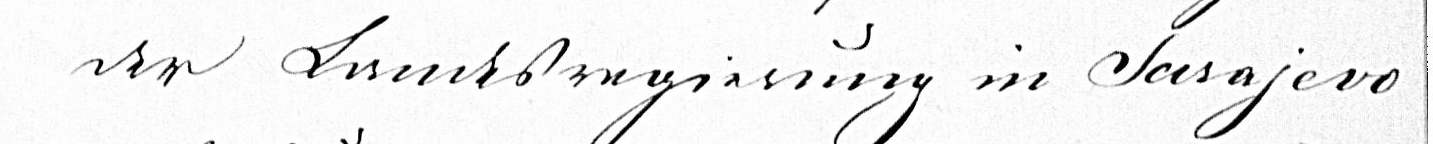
der Landesregierung in Sarajevo
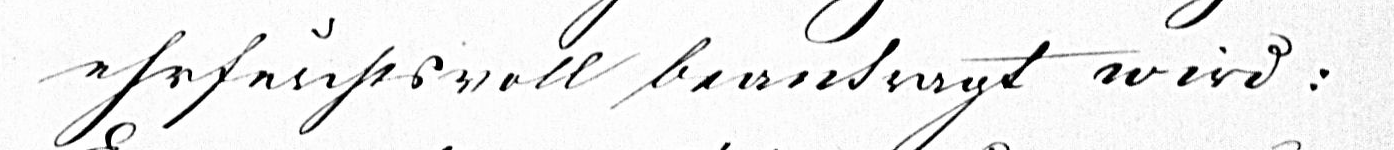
ehrfxxuchtsvoll beantragt wird:
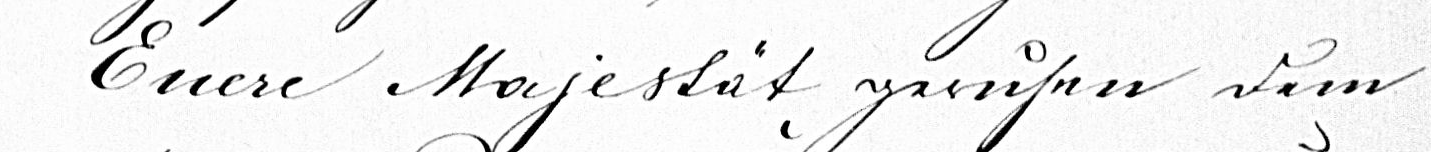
Euere Majestät geruhen dem
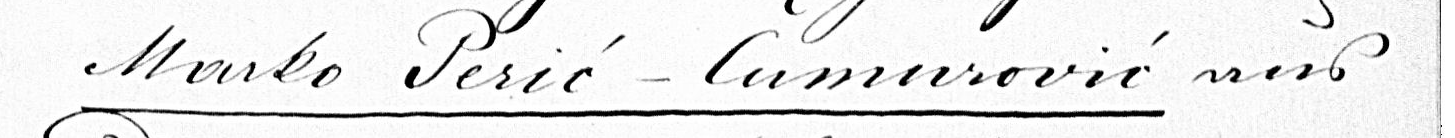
Marko Perić - Cumurović aus
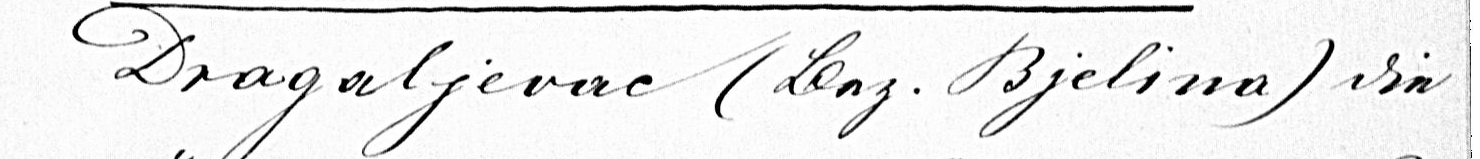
Dragaljevac (Bez. Bjelina) die
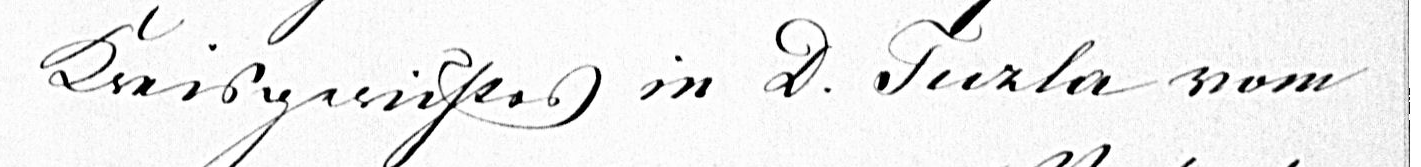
Kreisgerichtes in D. Tuzla vom
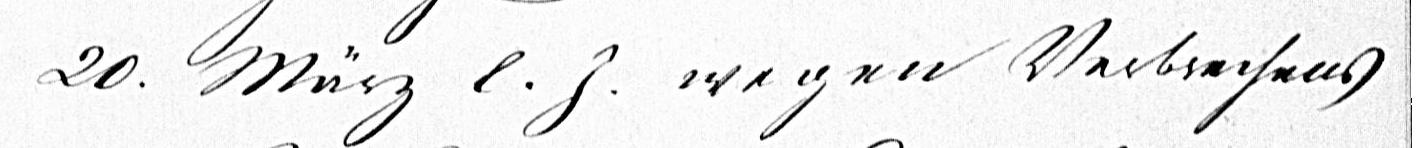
20. März l. J. wegen Verbrechens
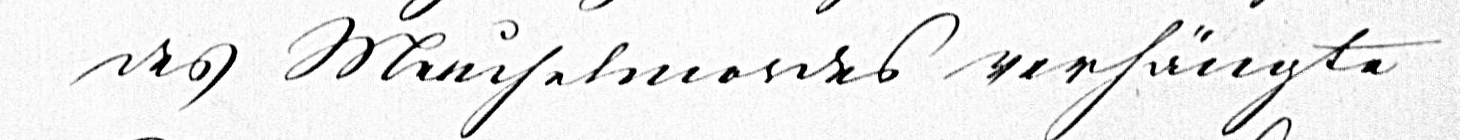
des Meuchelmordes verhängte
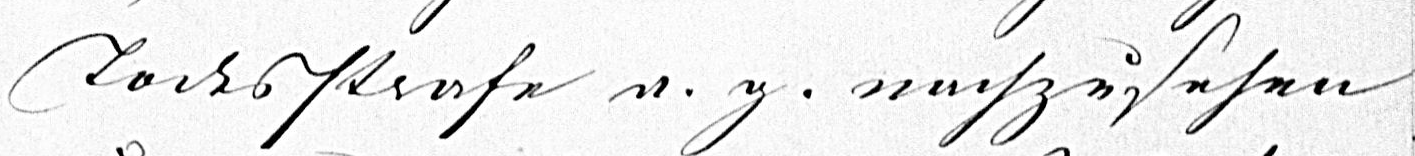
Todesstrafe a. g. nachzusehen
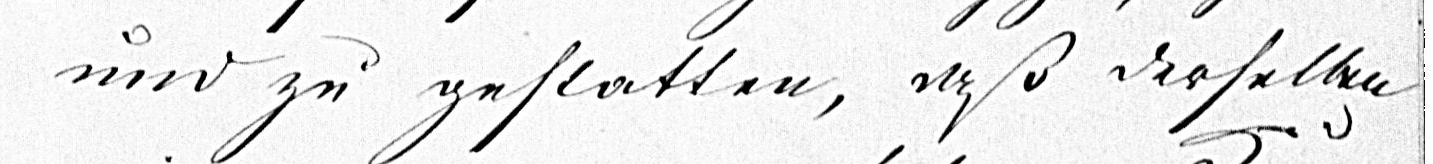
und zu gestatten, daß derselben
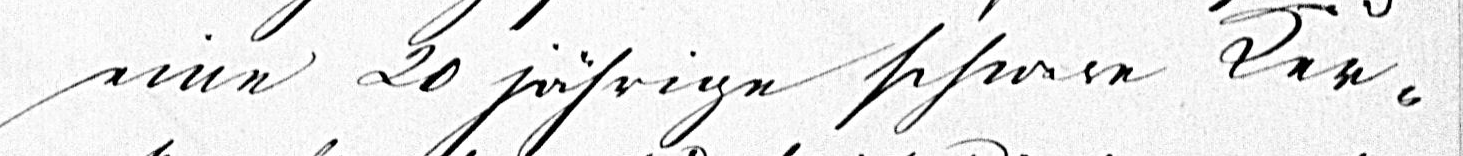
eine 20 jährige schwere Ker¬
